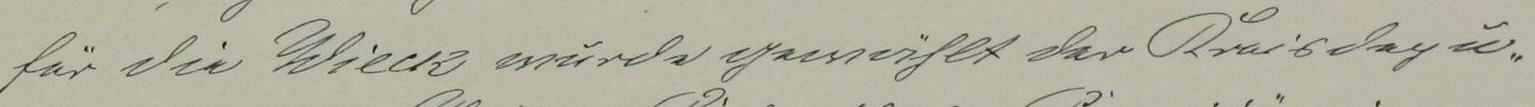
für die Wieck wurde gewählt der Kreisdepu-
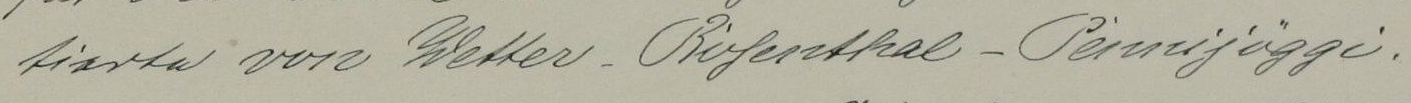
tierte von Wetter-Rosenthal-Pennijöggi.
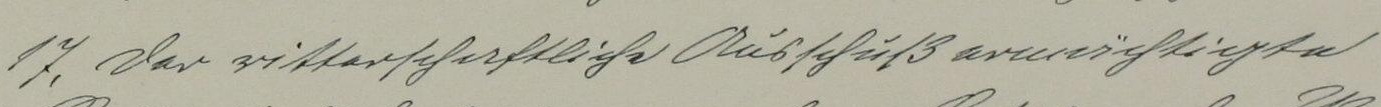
17. Der ritterschaftliche Ausschuß ermächtigte
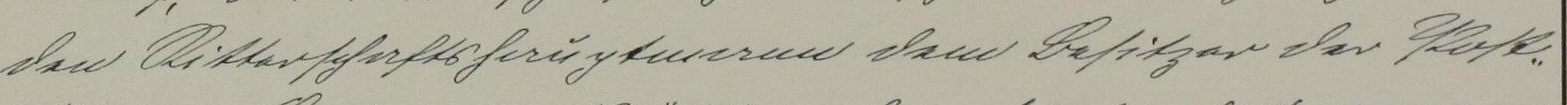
den Ritterschaftshauptmann dem Besitzer der Post-
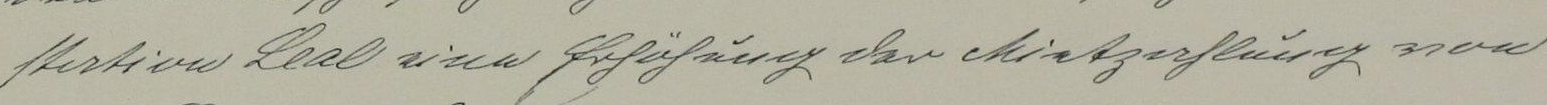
station Leal eine Erhöhung der Mietzahlung von
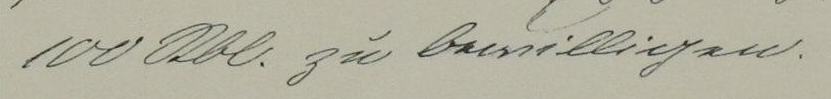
100 Rbl. zu bewilligen.
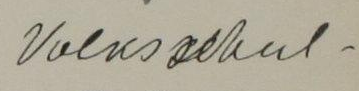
Volksschul
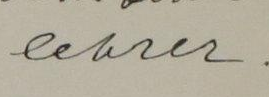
lehrer
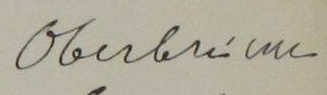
Oberbrücke
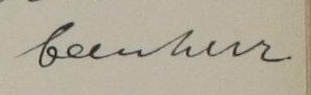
bauherr
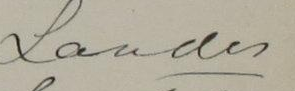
Landes
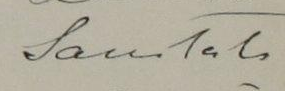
Sanitäts
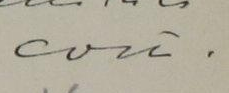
comm
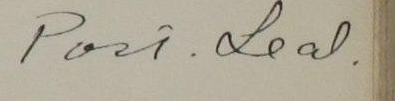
Post. Leal.
